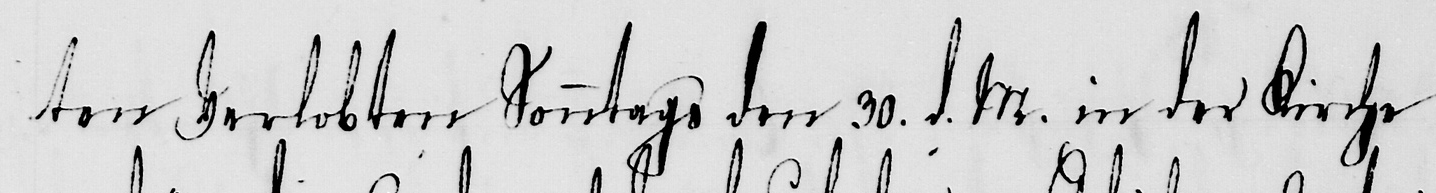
ten Verlobten Sonntags den 30. d. M. in der Kirche
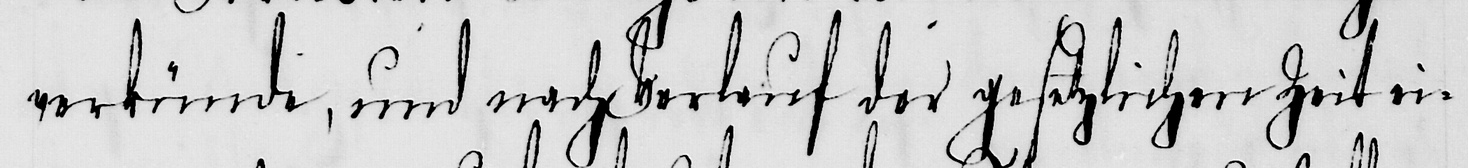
verkünde, und nach Verlauf der gesetzlichen Zeit ei¬
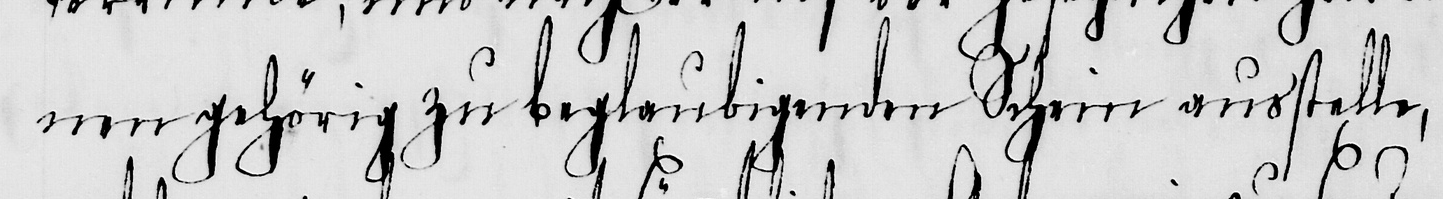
nen gehörig zu beglaubigenden Schein ausstelle,
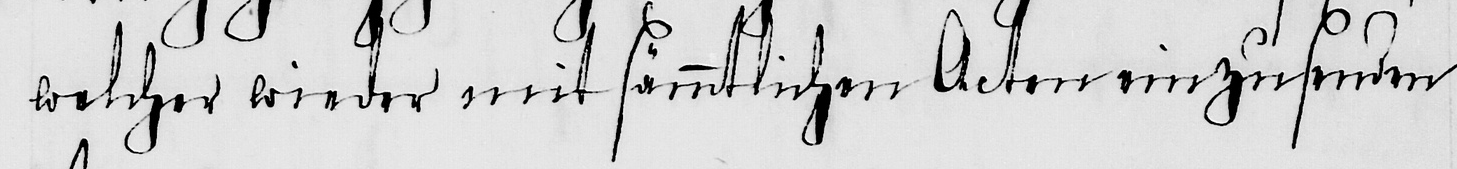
welcher wieder mit sämmtlichen Acten einzusenden
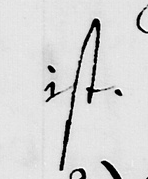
ist.
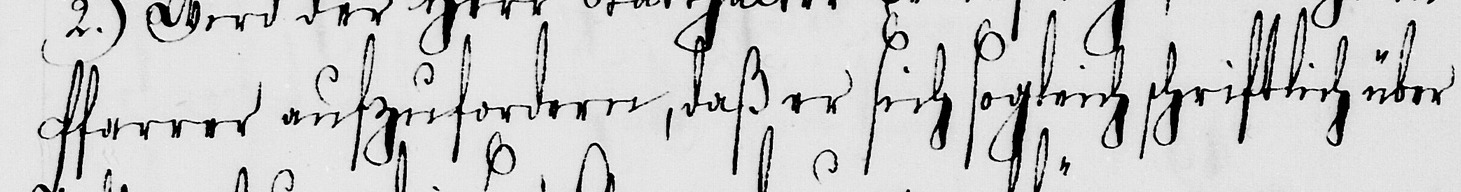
Pfarrer aufzufordern, daß er sich sogleich schri¬
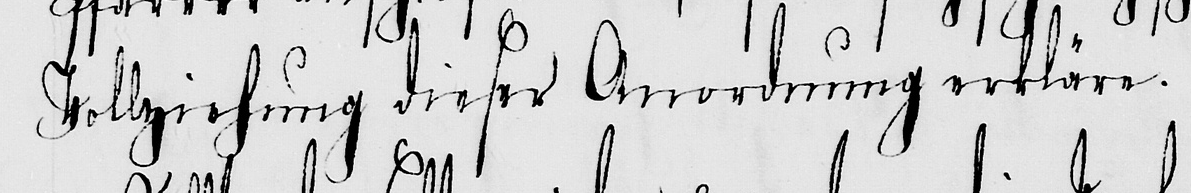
Vollziehung dieser Anordnung erkläre.
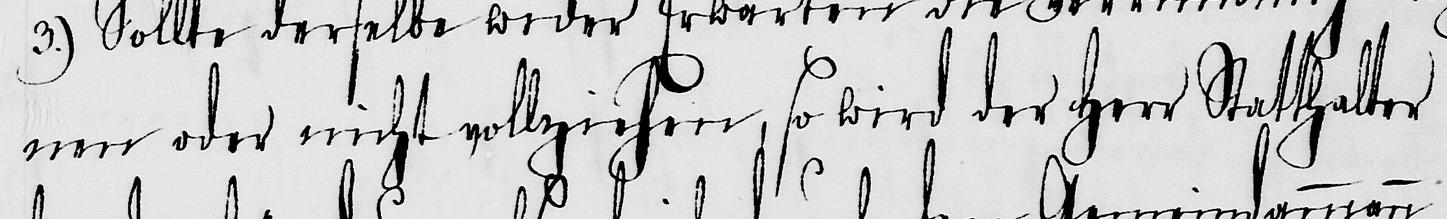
nen oder nicht vollziehen, so wird der Herr Stat¬
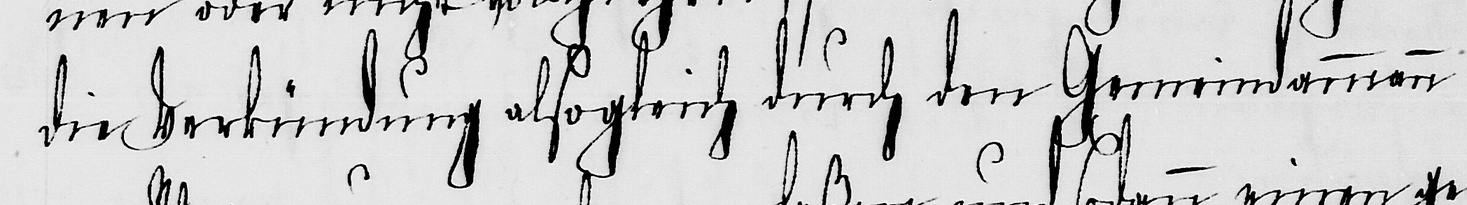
die Verkündung also gleich durch den Gemeindammann
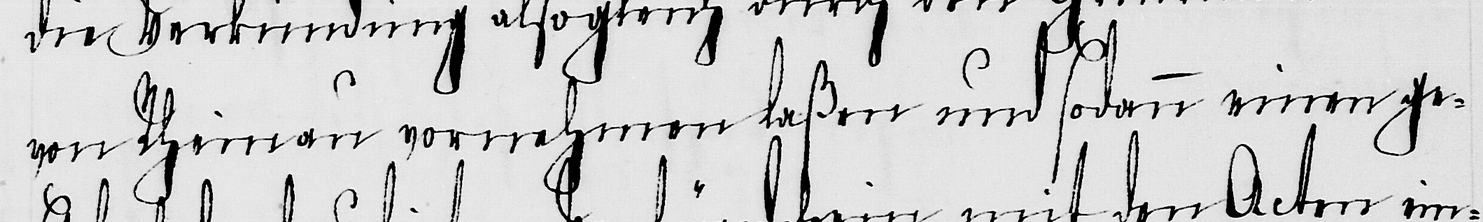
von Rheinau vornehmen laßen und sodann einen ges¬
